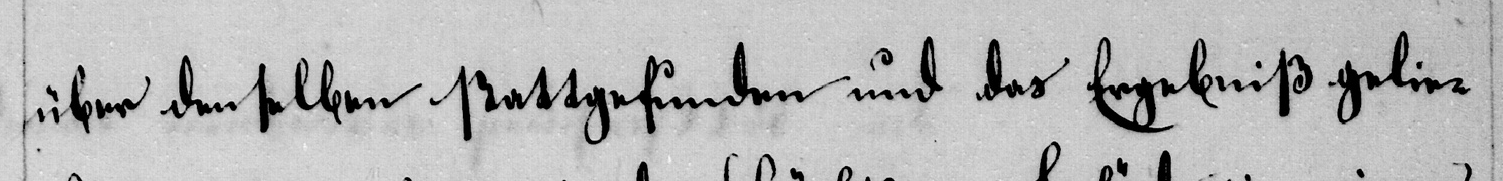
über denselben stattgefunden und das Ergebniß gelie¬
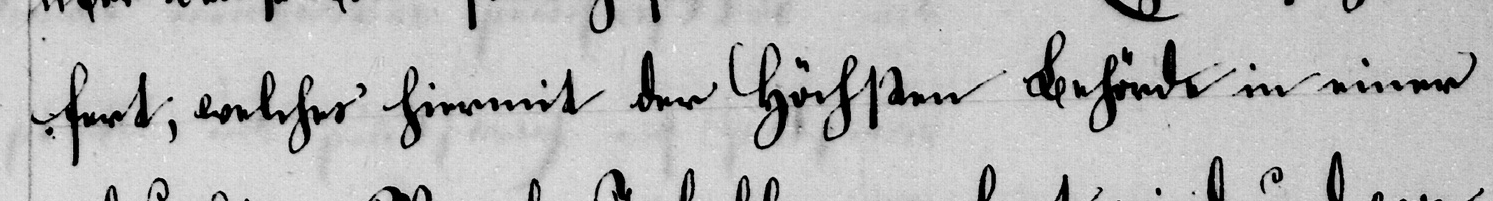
fert, welches hiermit der Höchsten Behörde in einer
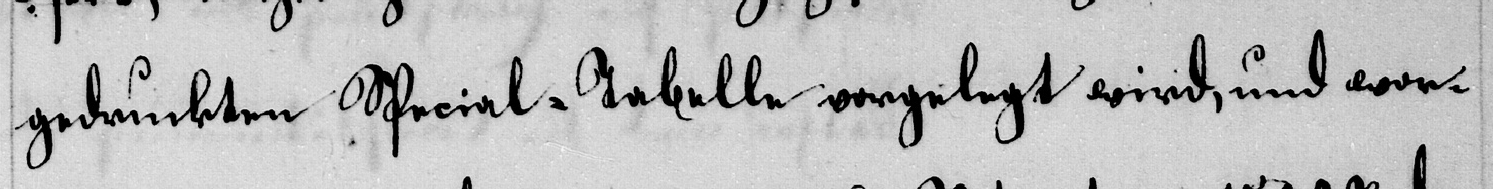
gedruckten Special-Tabelle vorgelegt wird, und wor¬
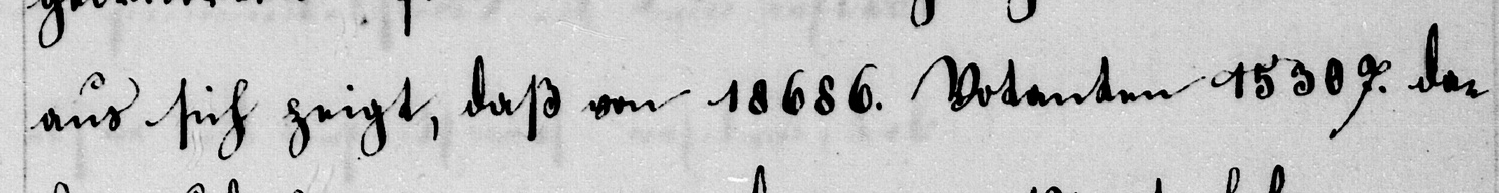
aus sich zeigt, daß von 18686. Votanten 15307. da¬
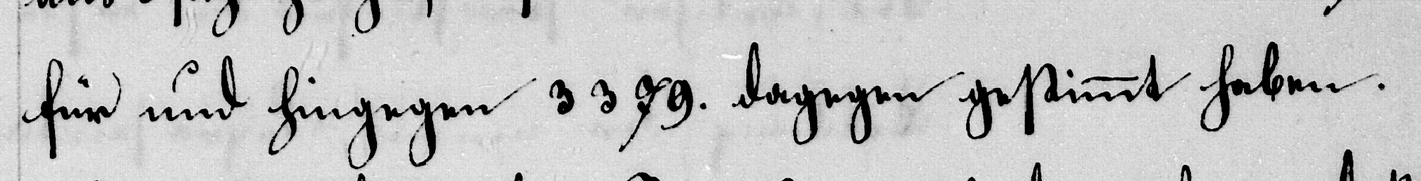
für und hingegen 3379. dagegen gestimmt haben.
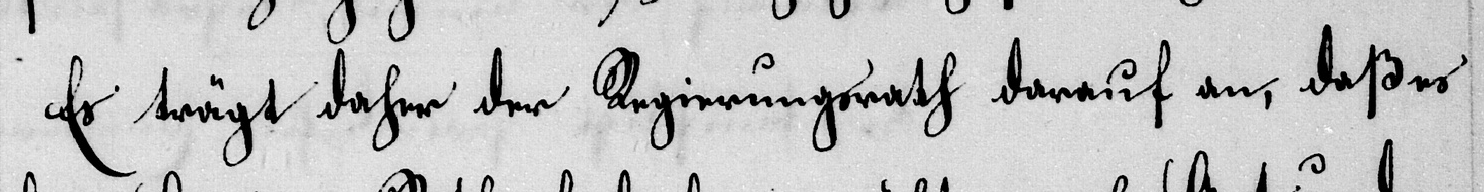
Es trägt daher der Regierungsrath darauf an, daß es
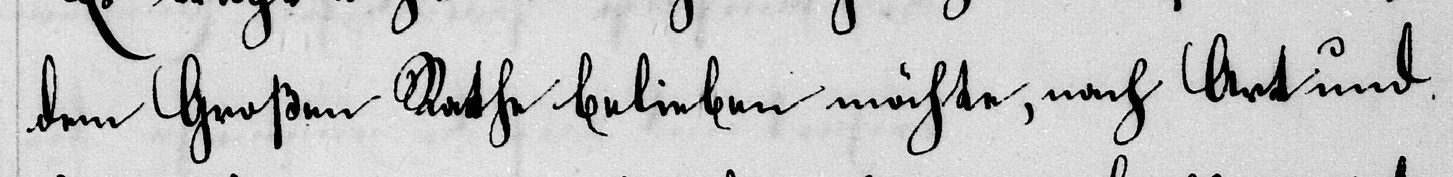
dem Großen Rathe belieben möchte, nach Art und
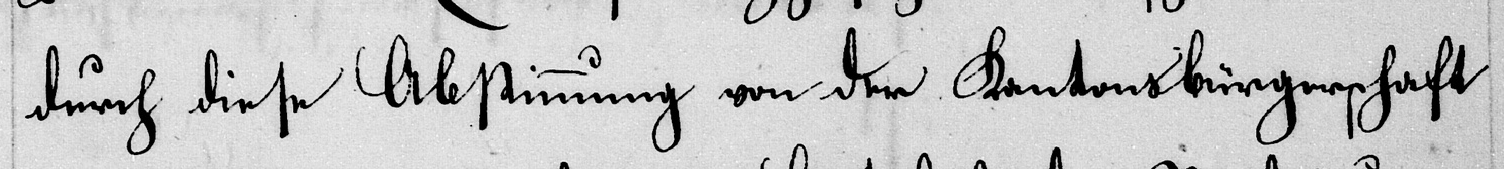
durch diese Abstimmung von der Kantonsbürgerschaft
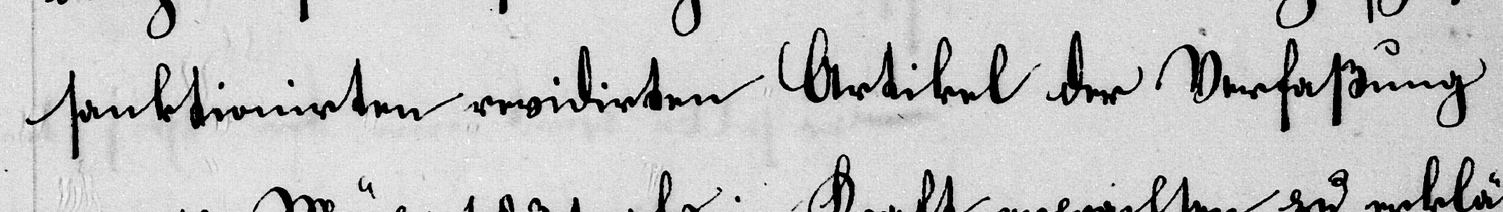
sanktionirten revidirten Artikel der Verfaßung
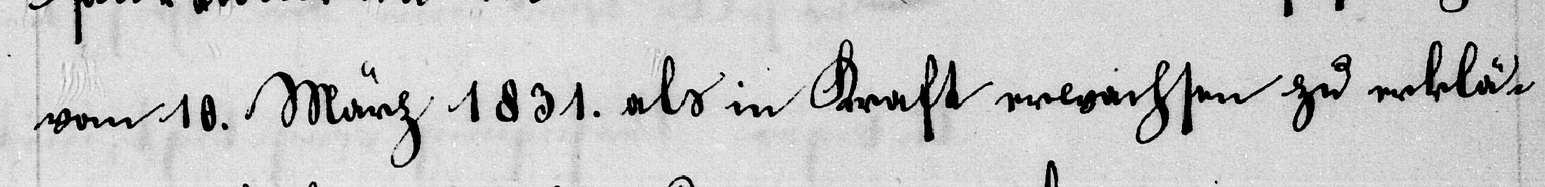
vom 10. März 1831. als in Kraft erwachsen zu erklä¬
